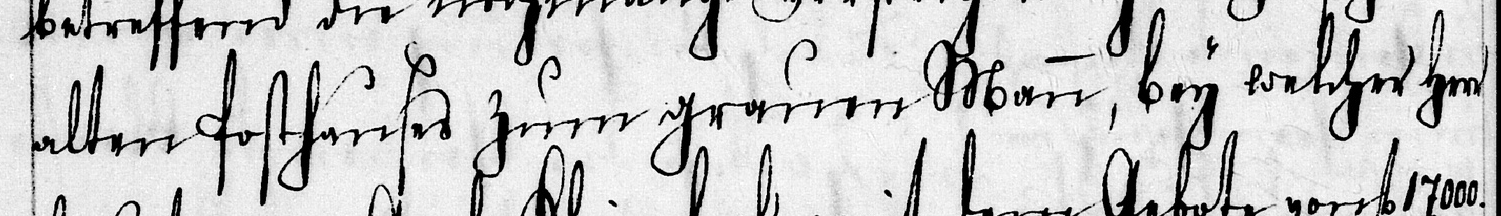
alten Posthauses zum grauen Mann, bey welcher Her¬
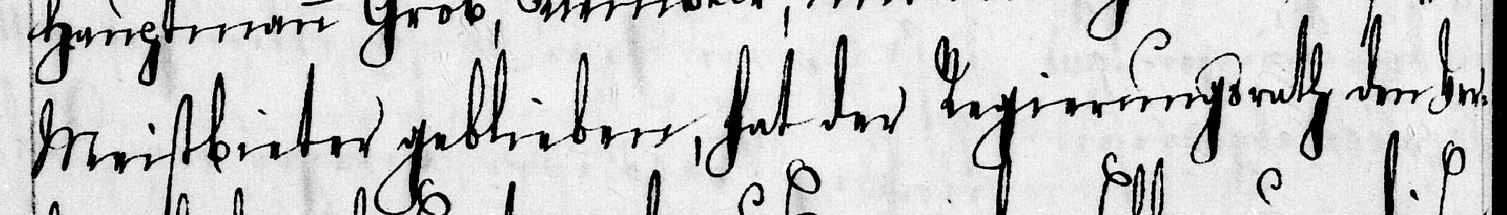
Meistbieter geblieben, hat der Regierungsrath den Ve¬
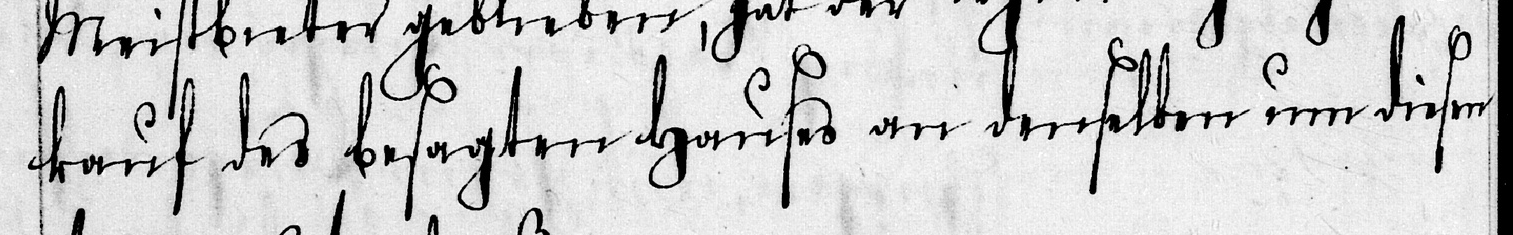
rkauf des besagten Hauses an denselben um diesen
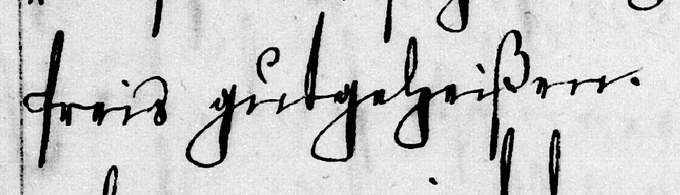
Preis gutgeheißen.
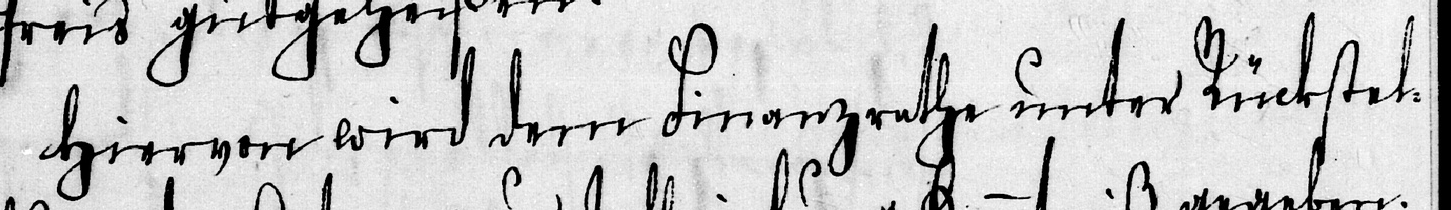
Hiervon wird dem Finanzrathe unter Rückstel¬
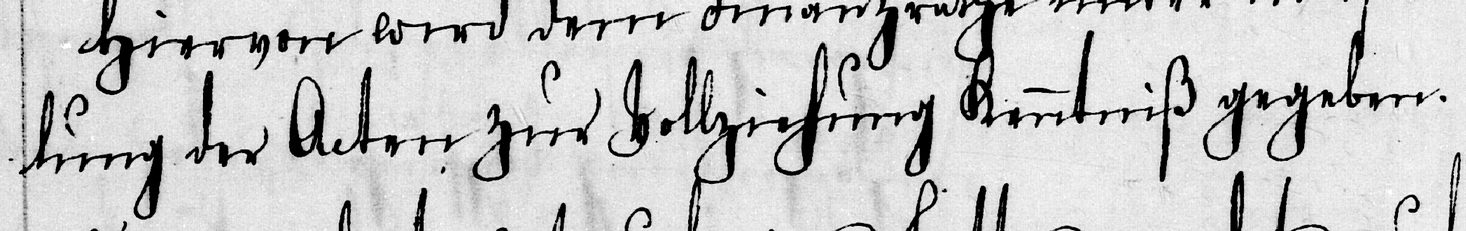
lung der Acten zur Vollziehung Kenntniß gegeben.
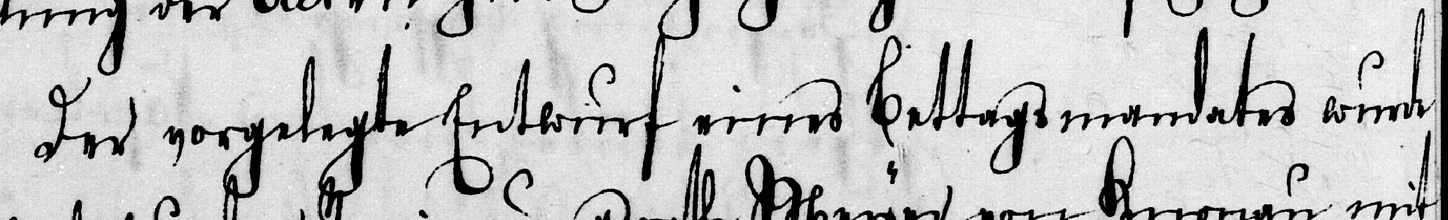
Der vorgelegte Entwurf eines Bettagsmandates wurde
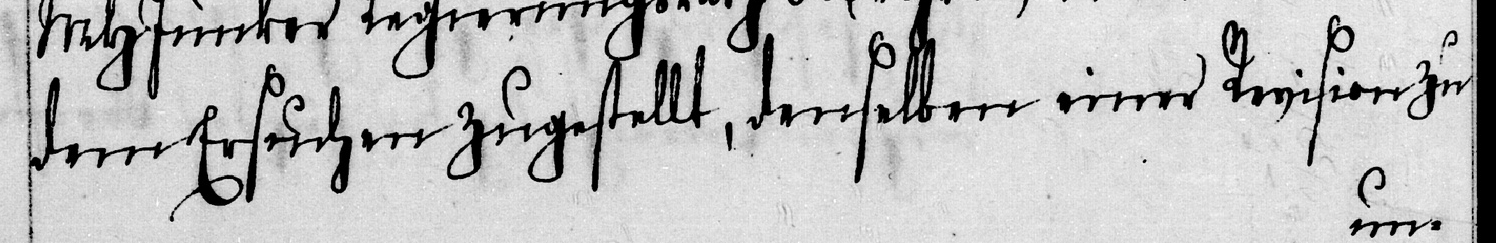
dem Ersuchen zugestellt, denselben einer Revision zu
